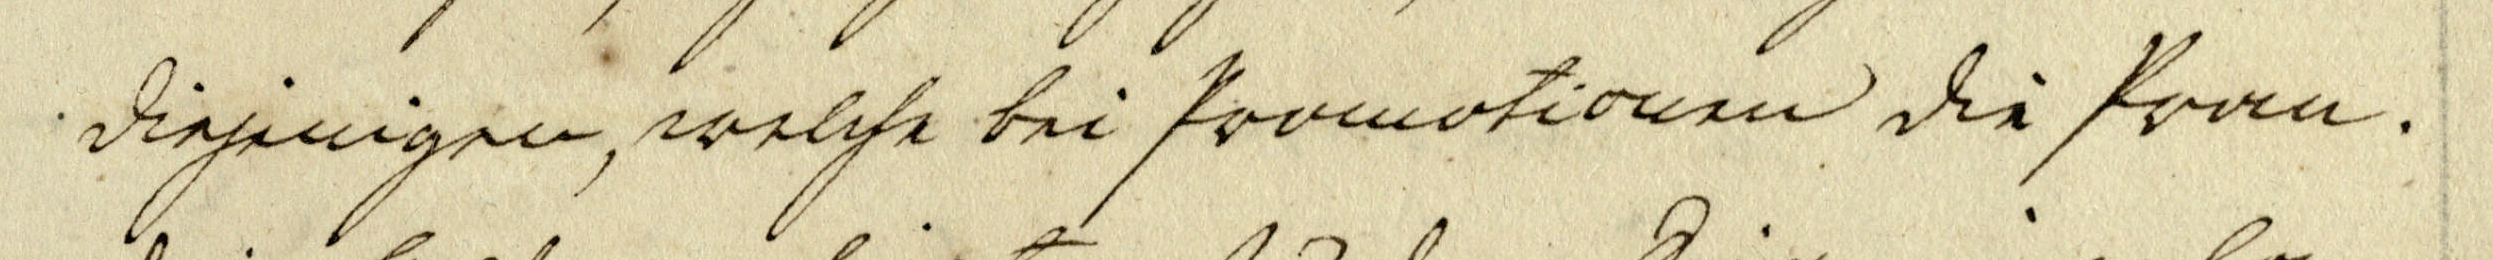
diejenigen, welche bei Promotionen die Pran¬
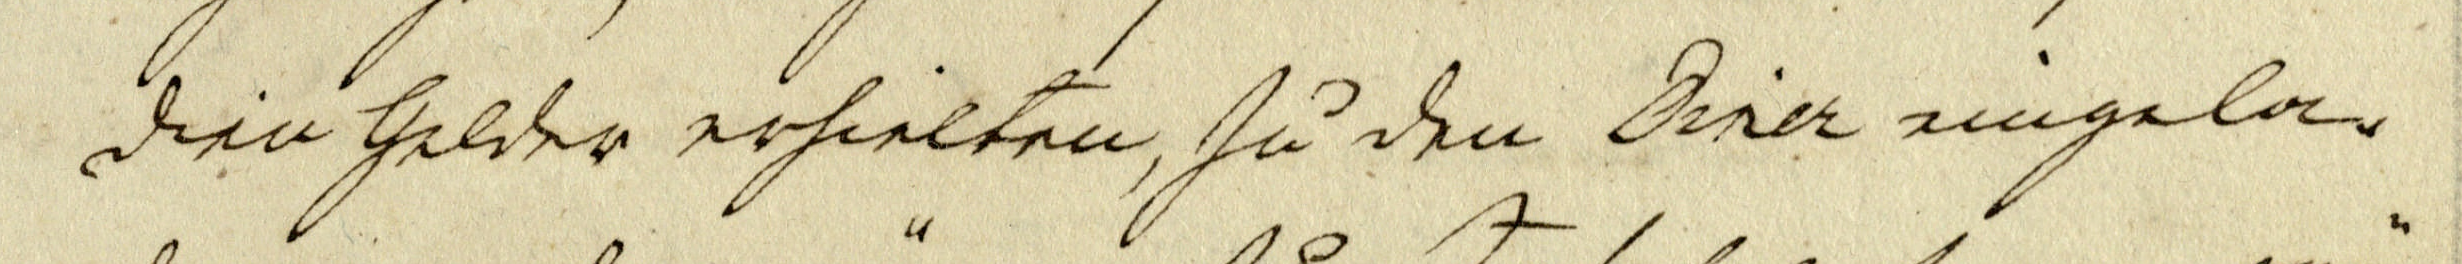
dien Gelder erhielten, zu den Diner eingela¬
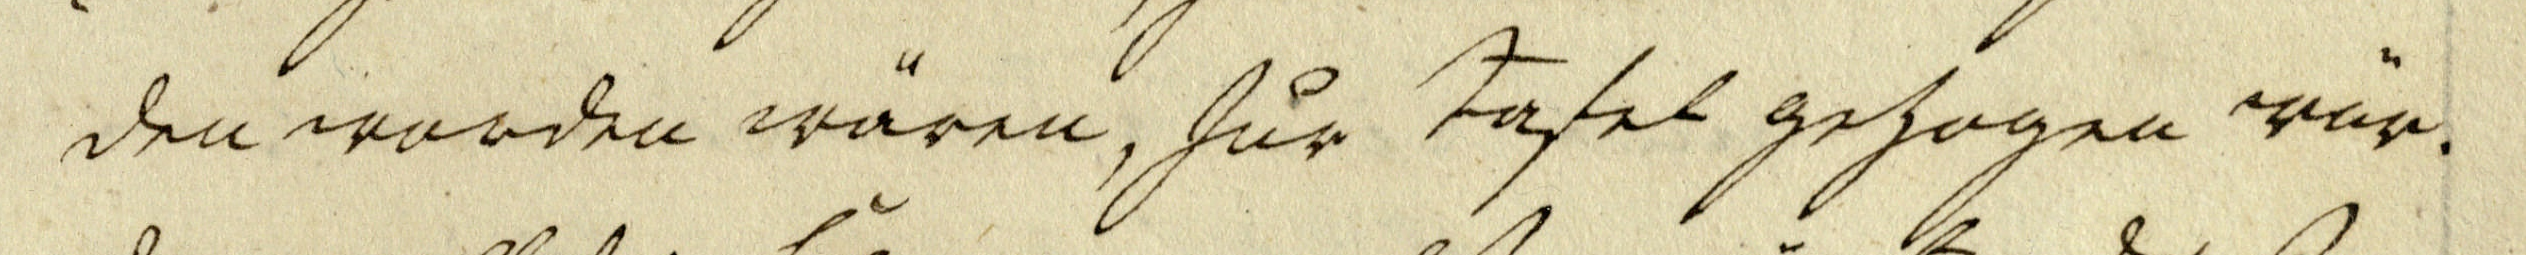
den worden wären, zur Tafel gezogen wür¬
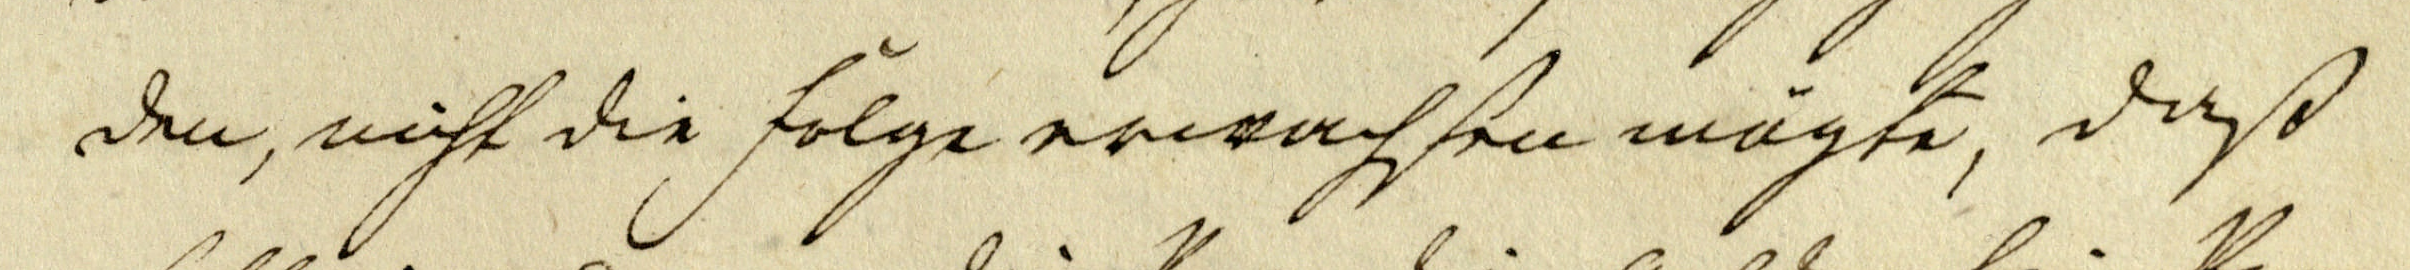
den, nicht die Folge erwachsen mögte, daß
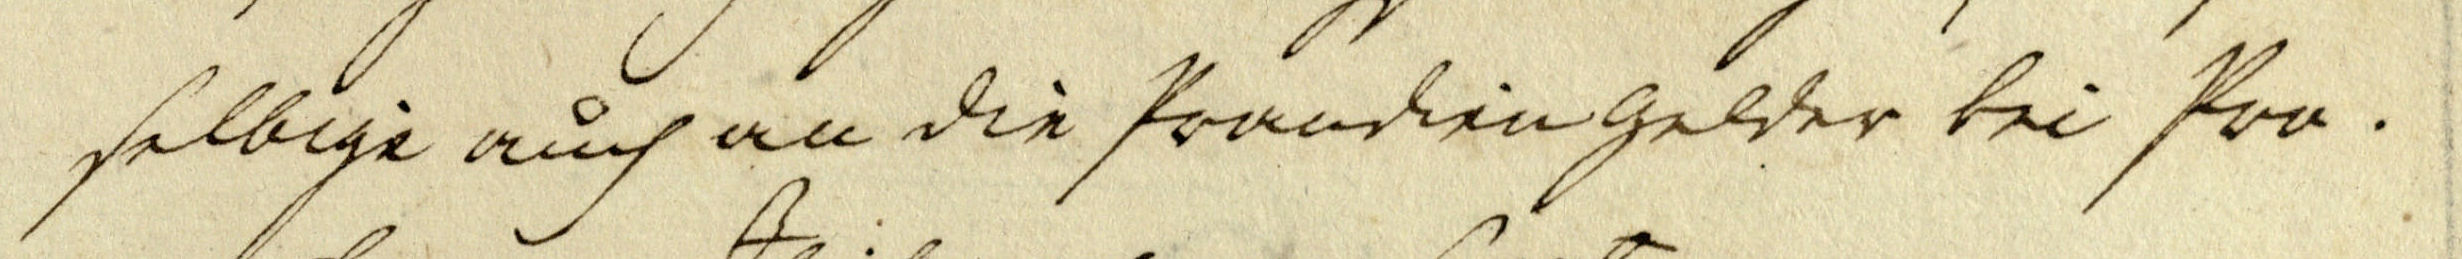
selbige auch an die Prandiengelder bei Pro¬
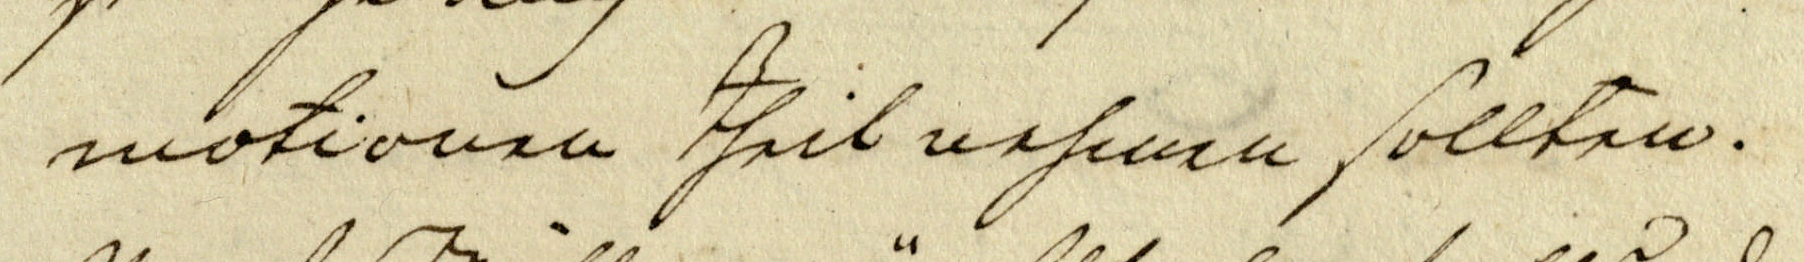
motionen Theil nehmen sollten.
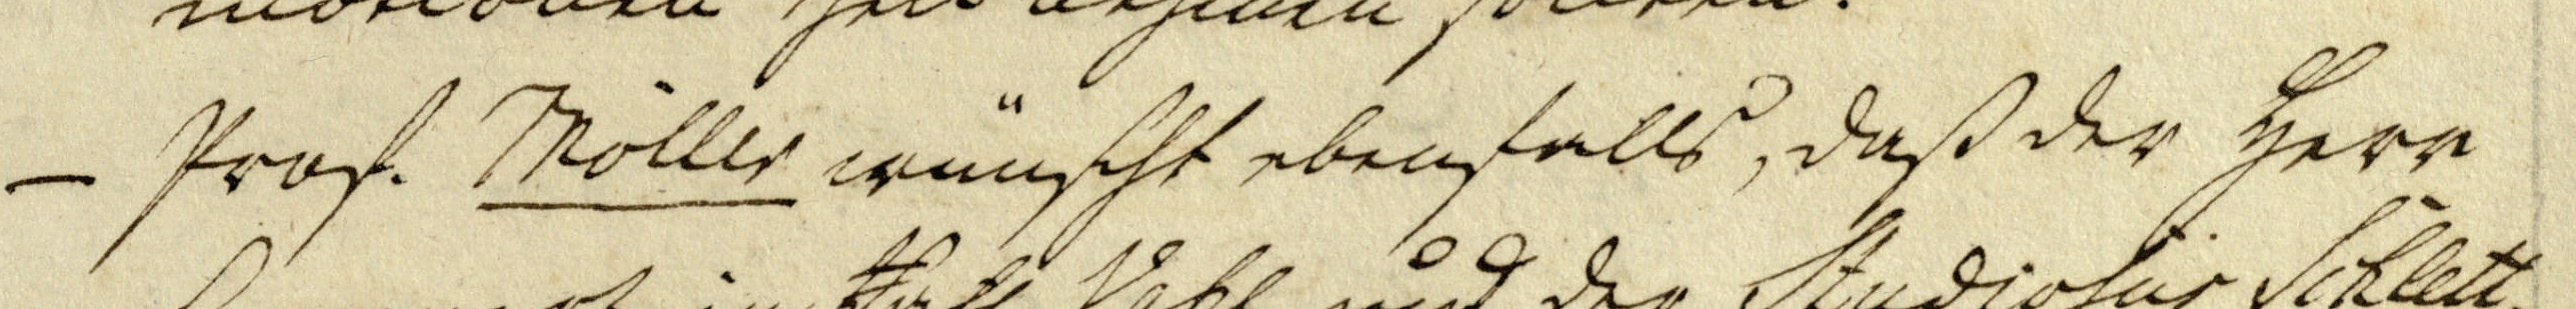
Prof. Möller wünscht ebenfalls, daß der Herr
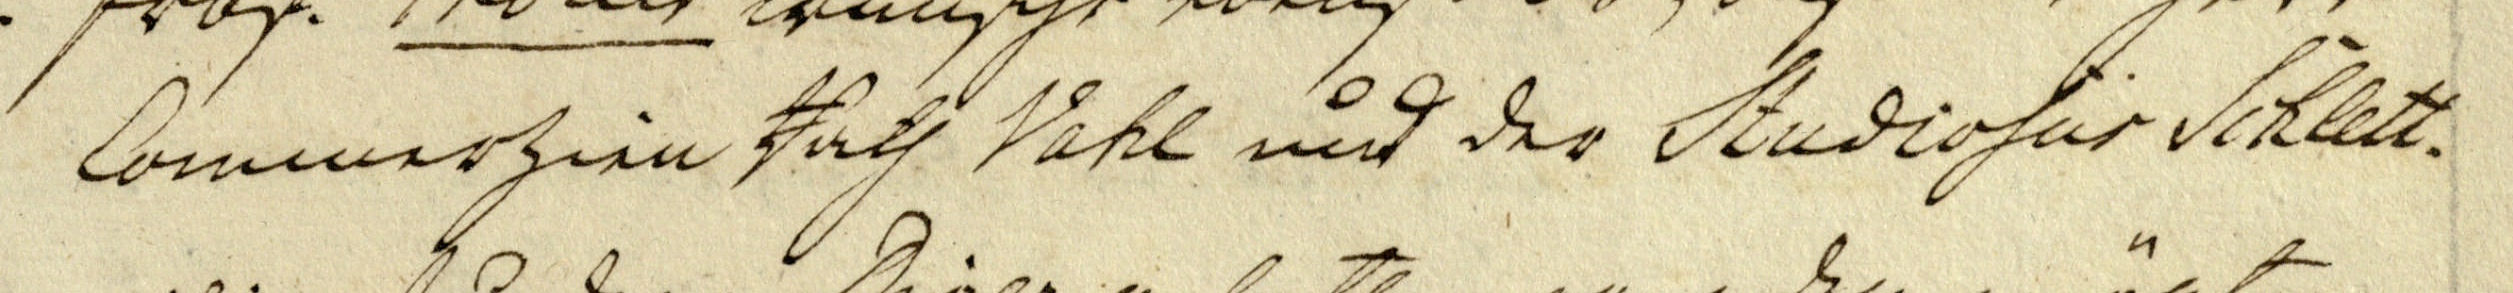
Commerzien Rath Wahl und der Studiosus Schlett¬
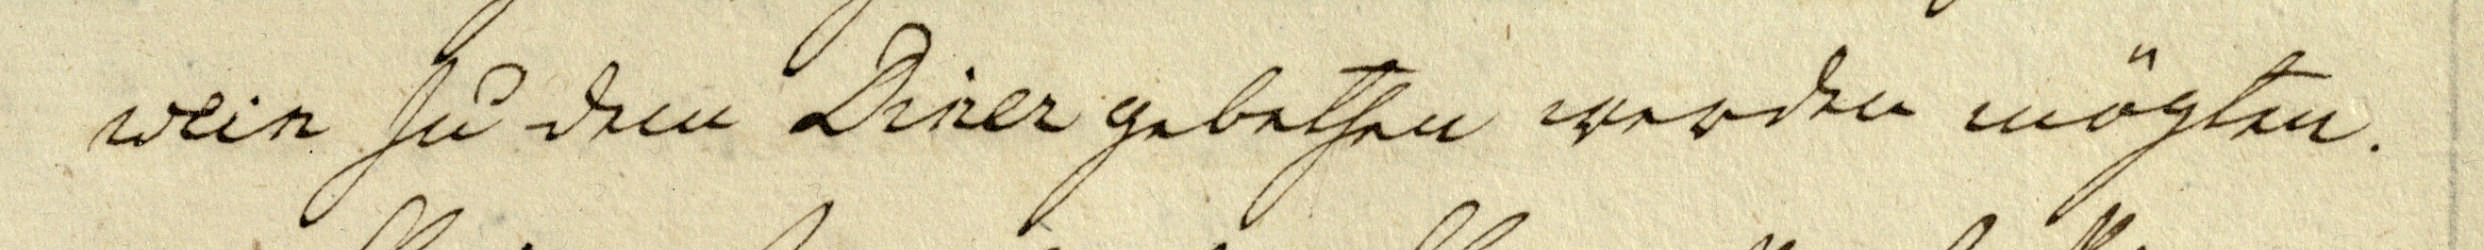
wein zu dem Diner gebethen werden mögten.
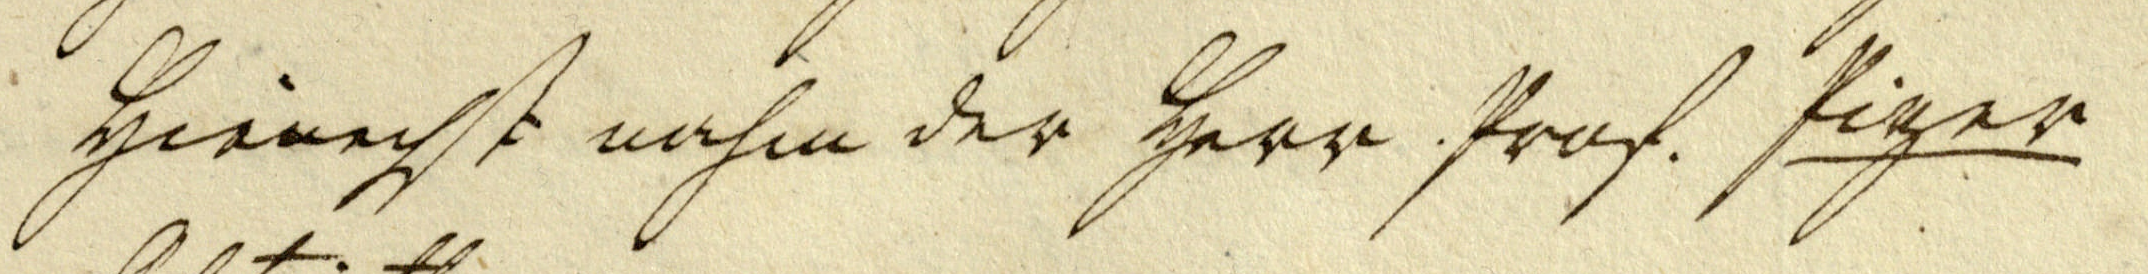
Hienechst nahm der Herr Prof. Piper
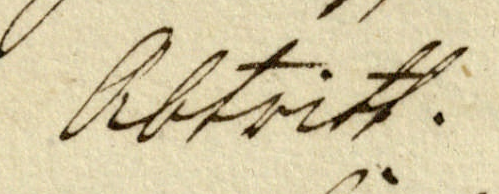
Abtritt.
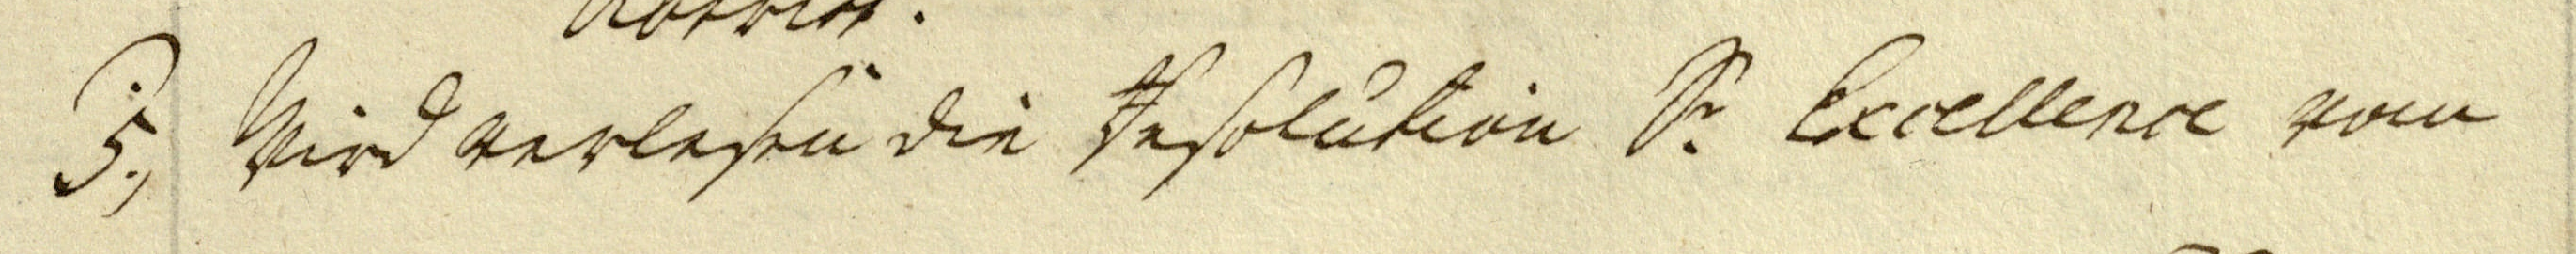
5., Wird verlesen die Resolution Sr Excellence vom
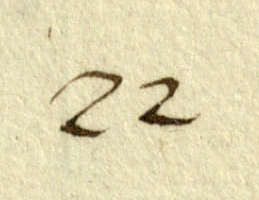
22
